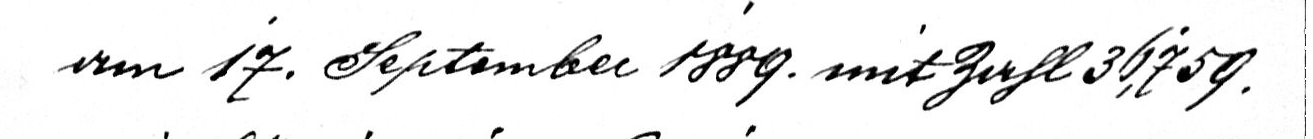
am 17. September 1889. mit Zahl 36,759.
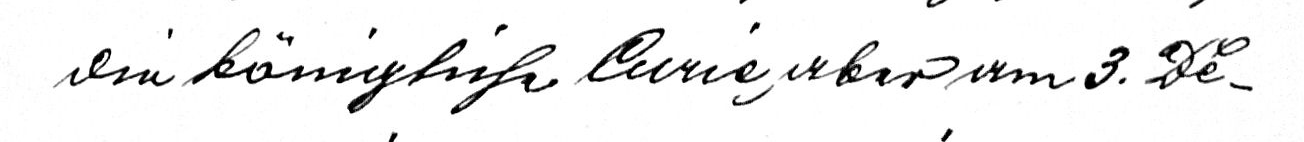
die königliche Curie aber am 3. De¬
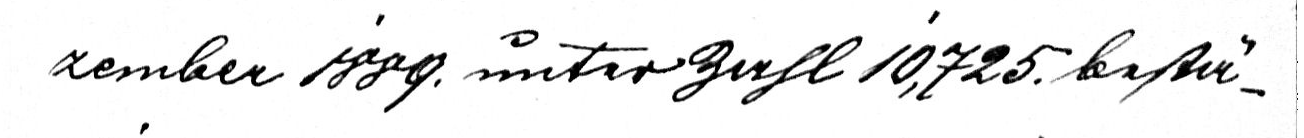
zember 1889. unter Zahl 10,725. bestä¬
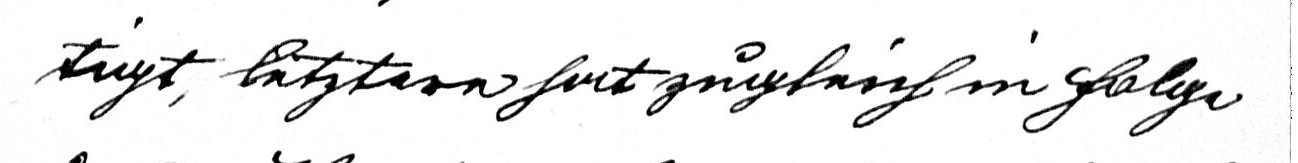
tigt, letztere hat zugleich in folge
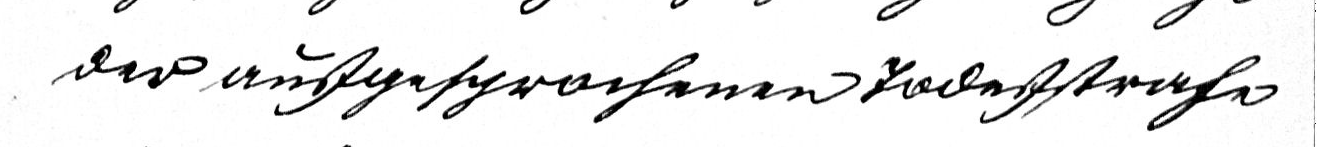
der ausgeschprochenen Todesstrafe
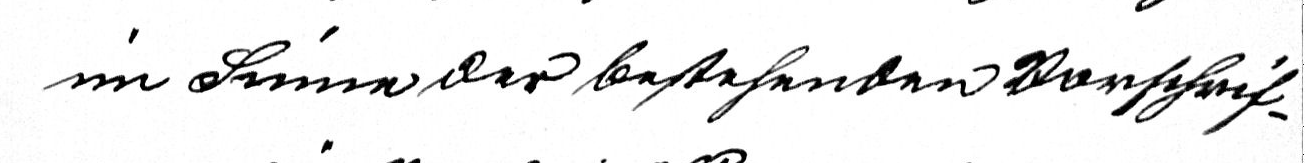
im Sinne der bestehenden Vorschrif¬
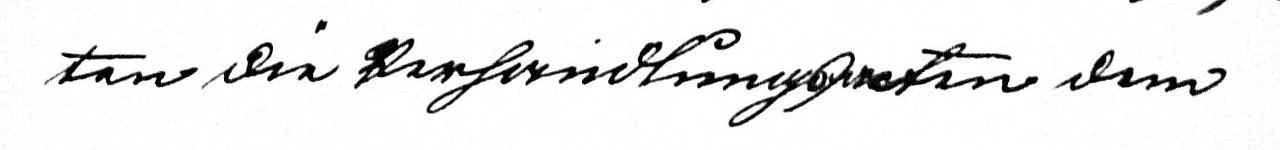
ten die Verhandlungsarten dem
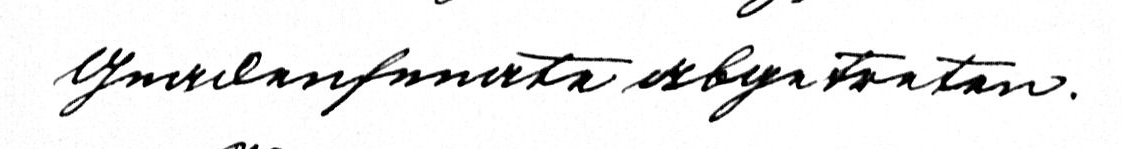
Gnadensenate abgetreten.
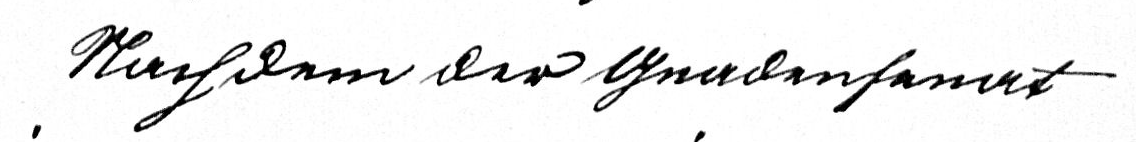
Nachdem der Gnadensenat
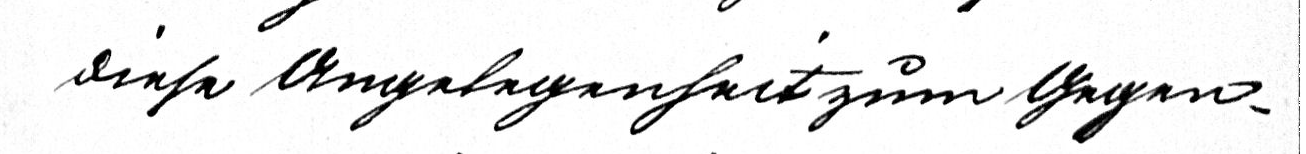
diese Angelegenheit zum Gegen¬
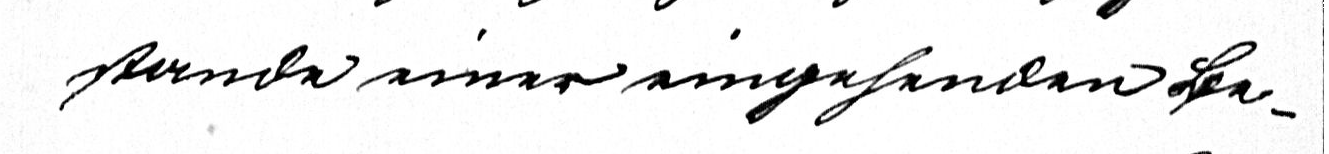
stande einer eingehenden Be¬
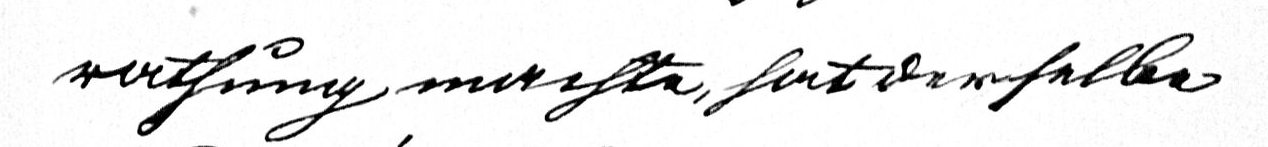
rathung machte, hat derselbe
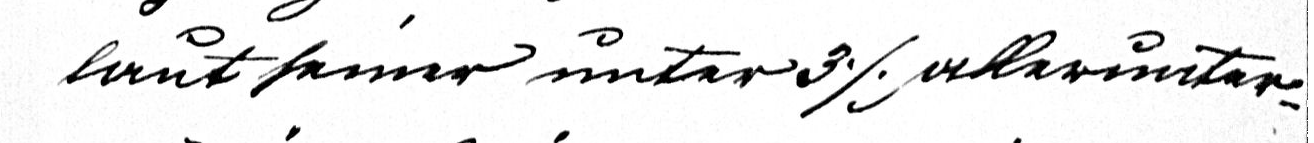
laut seiner unter 3./. allerunter¬
